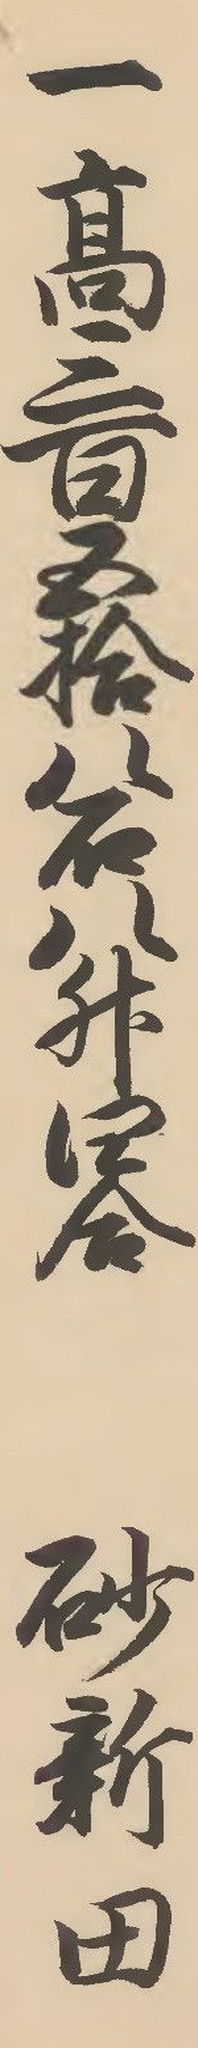一高三百五拾八石八升四合砂新田
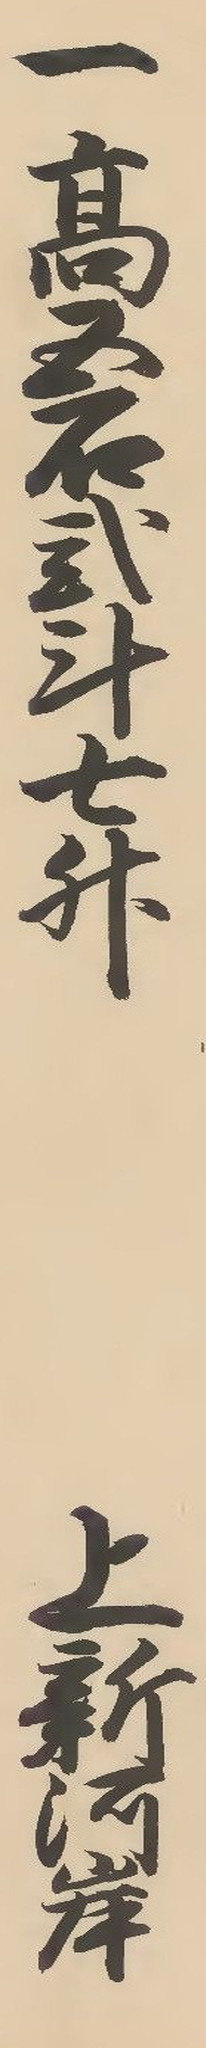一高五石弐斗七升上新河岸
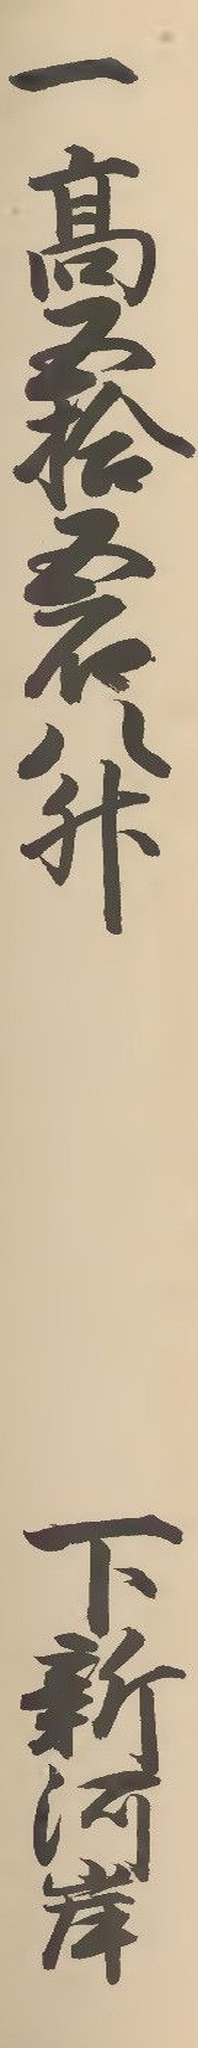一高五拾五石八升下新河岸
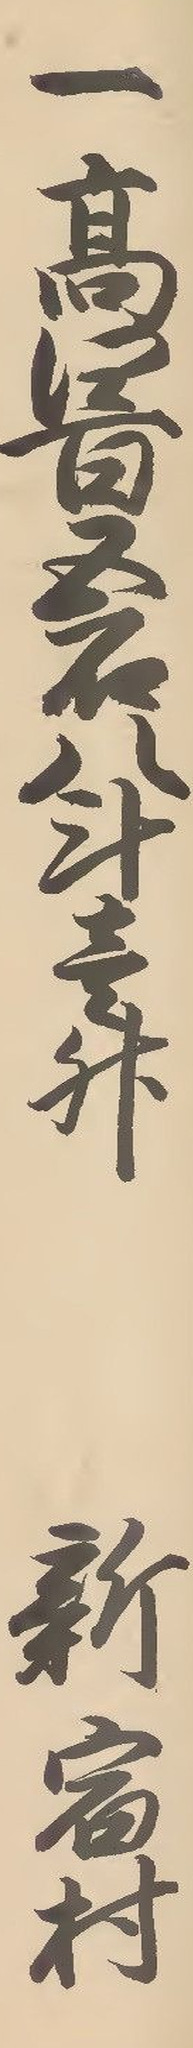一高四百五石八斗壱升新宿村
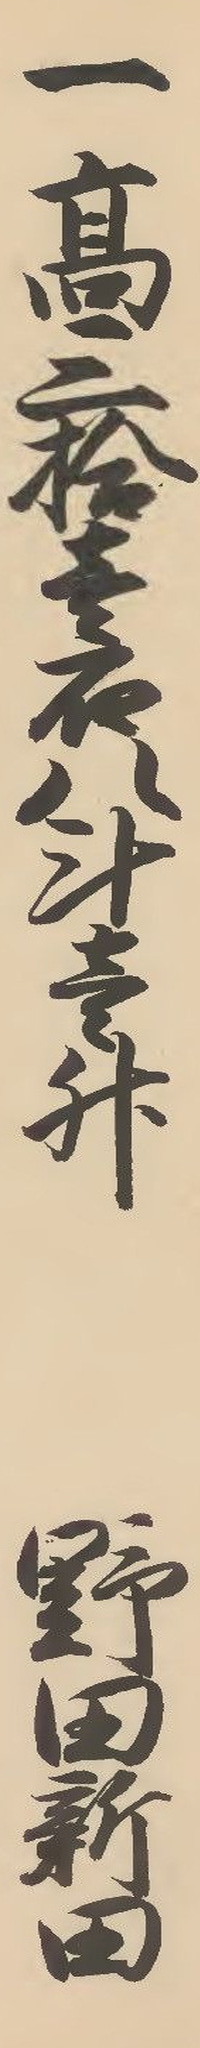一高三袷壱石八斗壱升野田新田
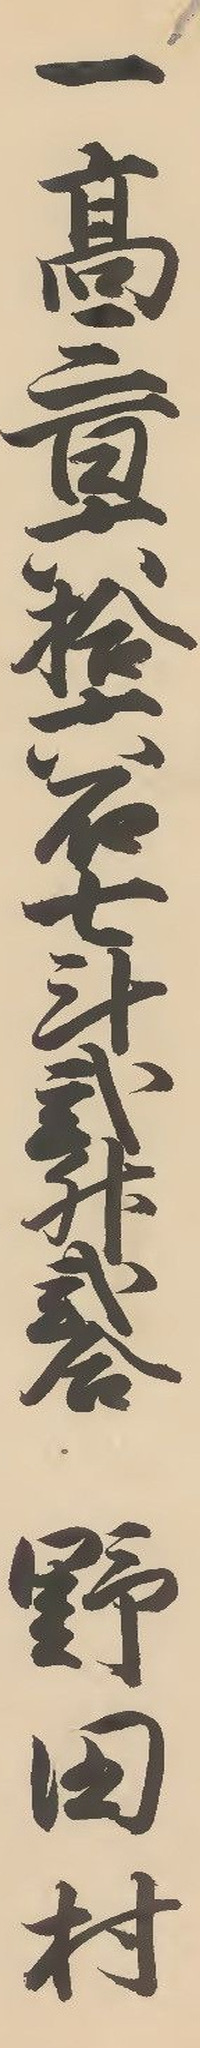一高三百六拾六石七斗弐升弐合野田村
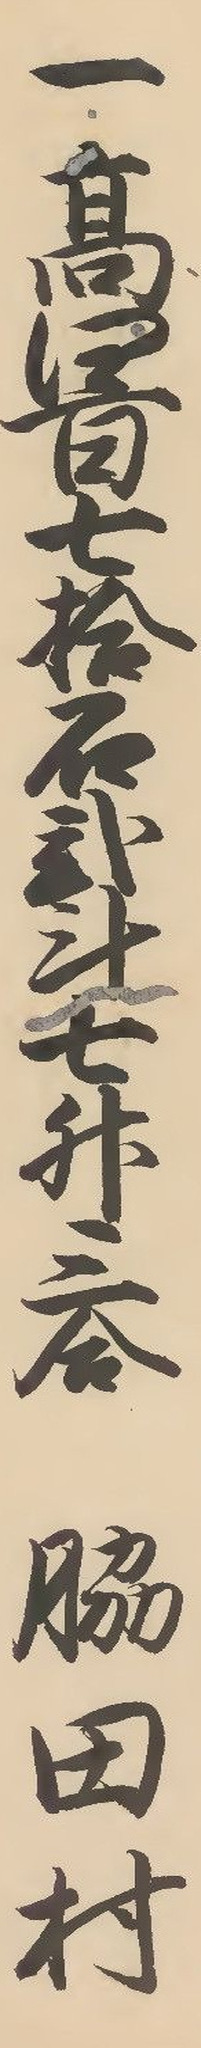一高四百七拾石弐斗七升三合脇田村

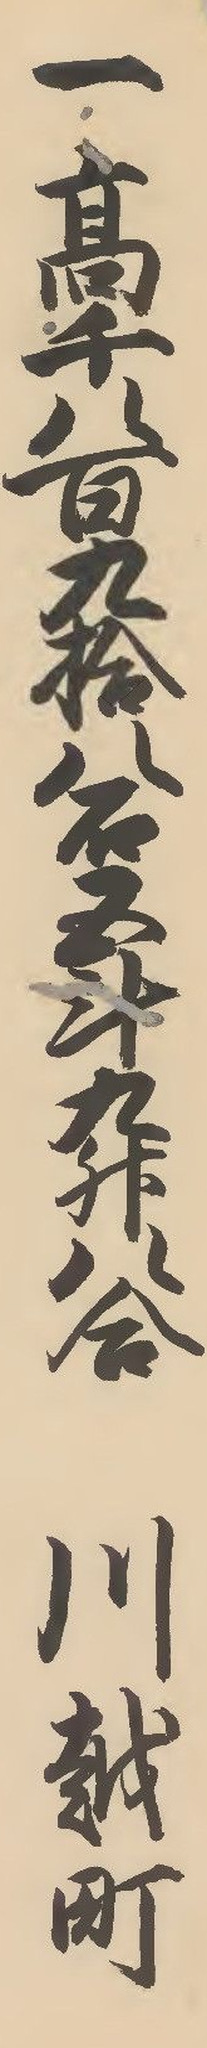一高千八百九拾八石五斗九升八合川越町
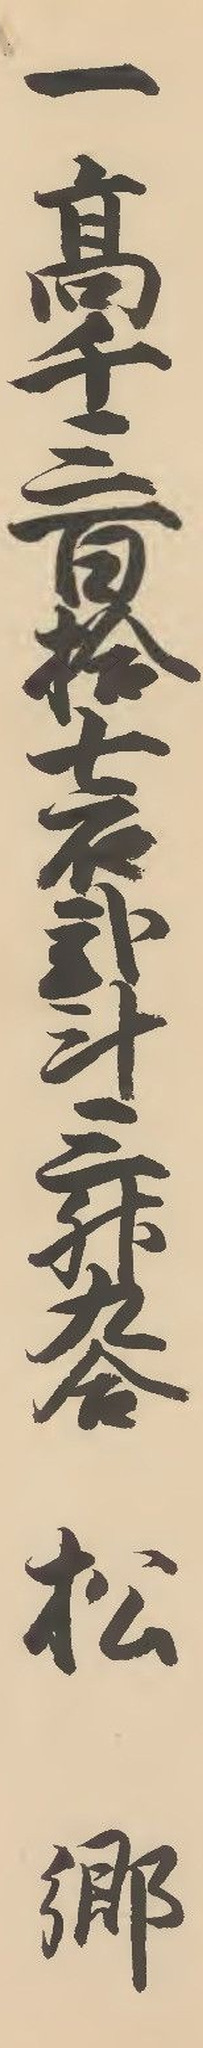一高千三百拾七石弐斗三升九合松郷
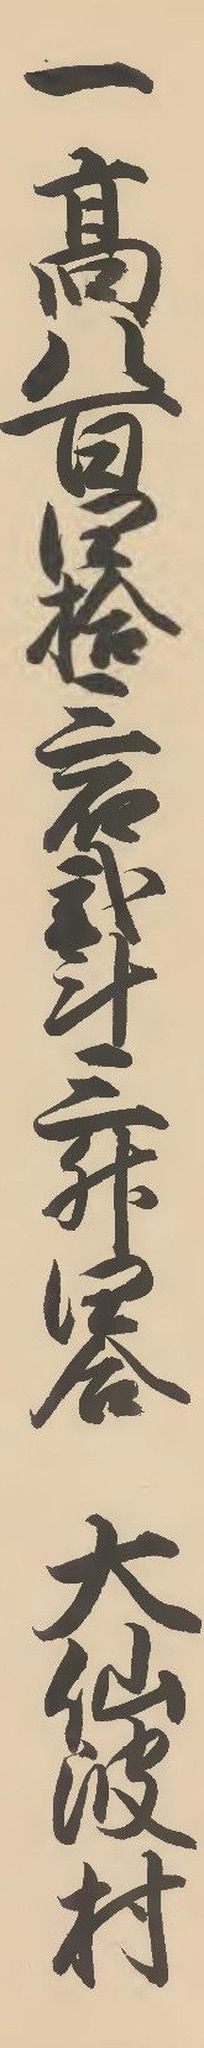一高八百四拾三石弐斗三升四合大仙波村
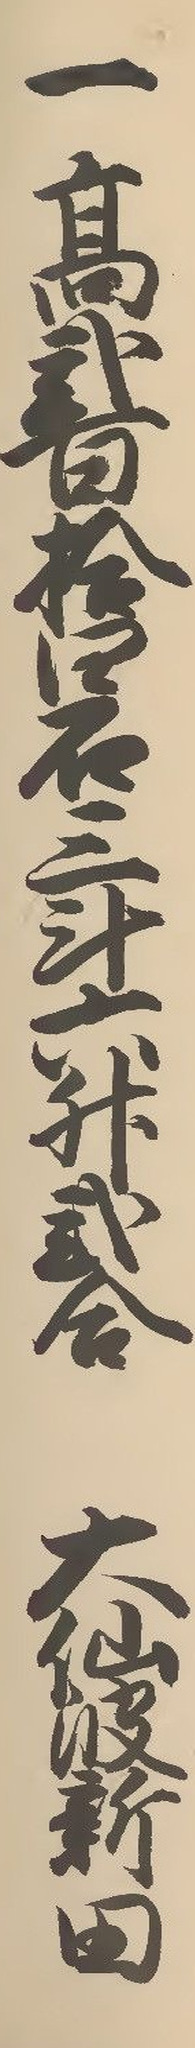一高弐百拾四石三斗六升弐合大仙波新田
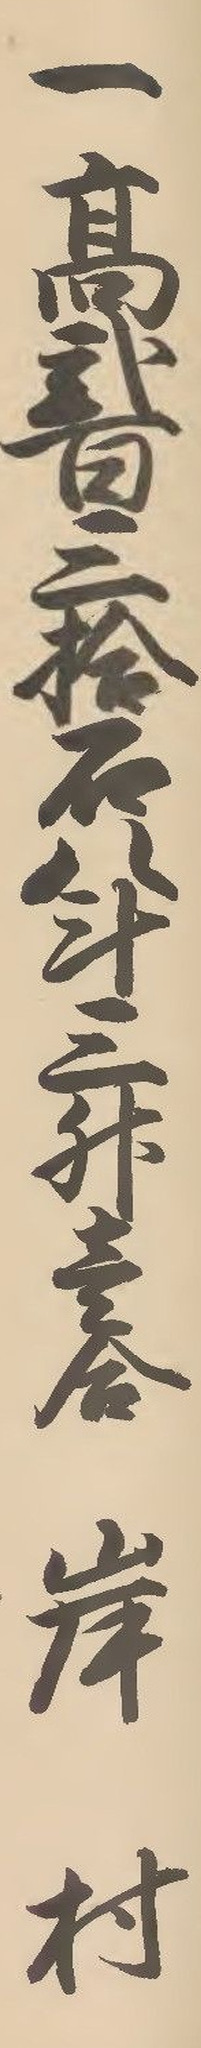一高弐百三拾石八斗三升壱合岸村
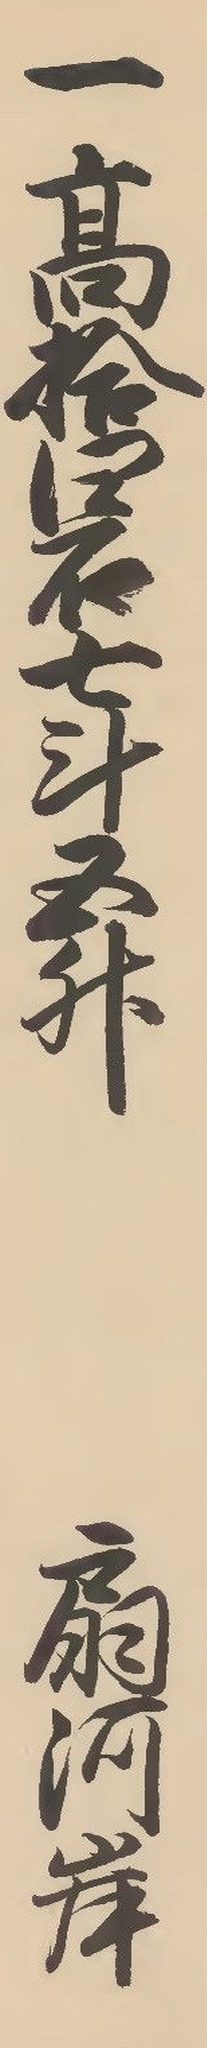一高拾四石七斗五升扇河岸
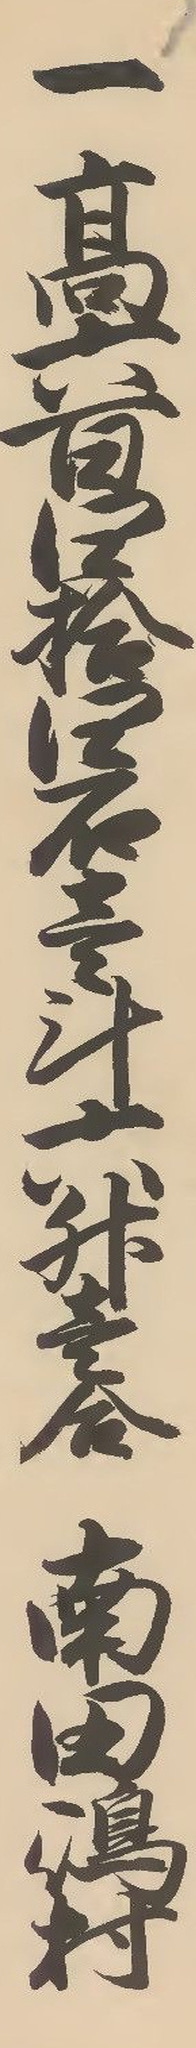一高六百四拾四石壱斗六升壱合南田嶋村
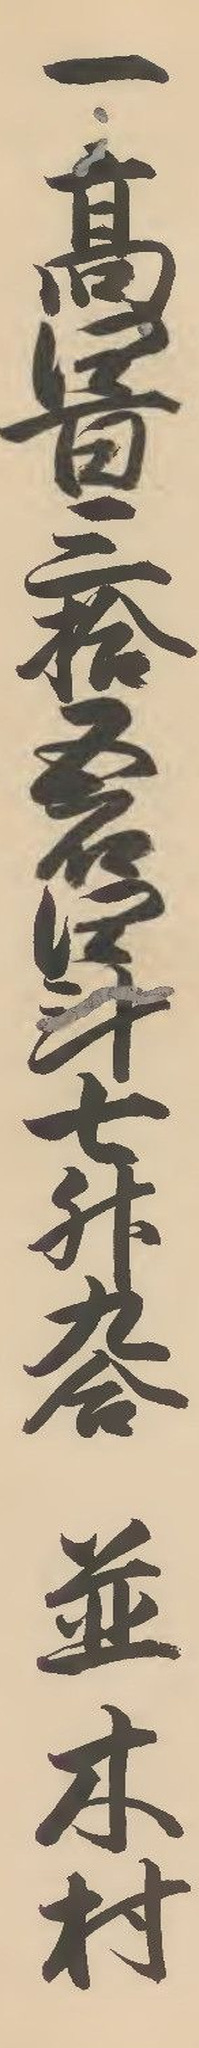一高四百三拾五石四斗七升九合並木村

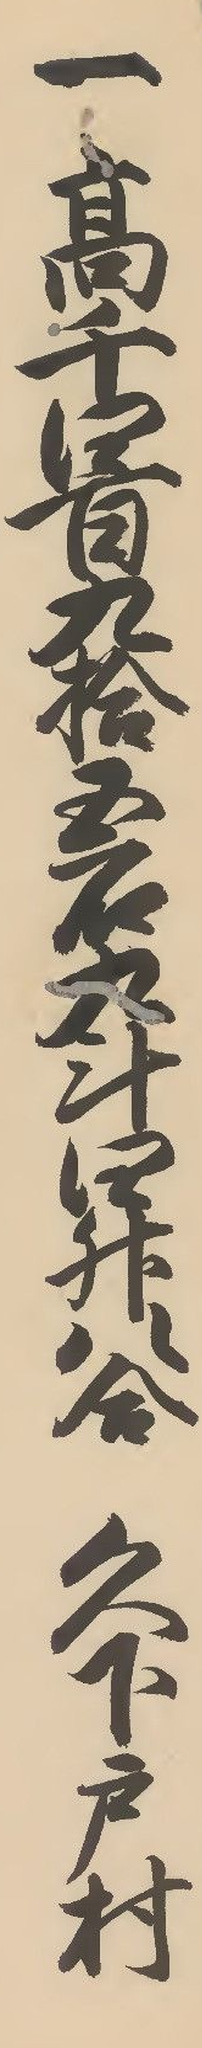一高千四百九拾五石九斗四升八合久下戸村
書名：武蔵国郷帳　上
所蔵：国立公文書館 National Archives of Japan
